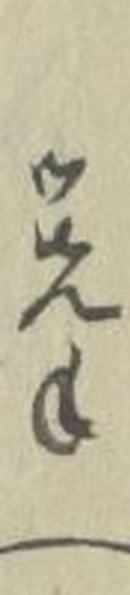御先手
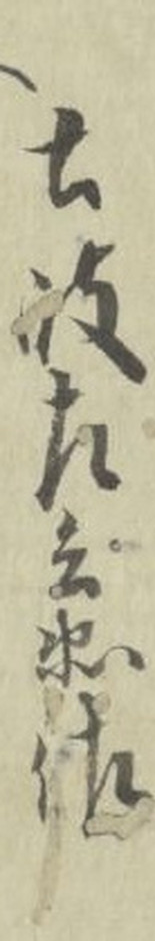土岐左兵衛佐
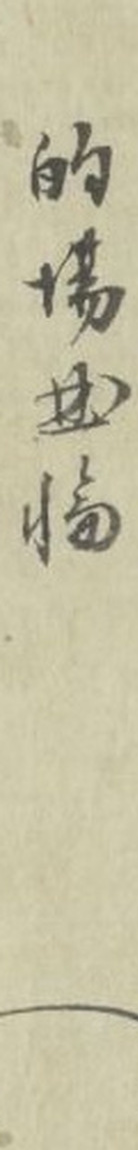的場曲幡
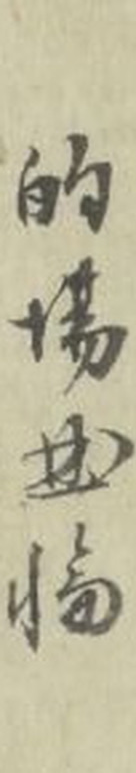的場曲幡
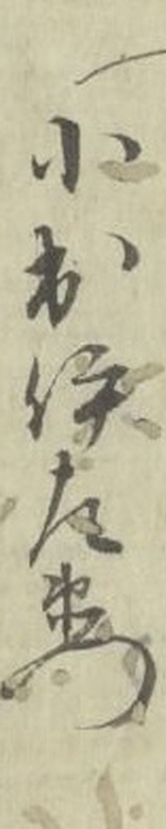小出伊左衛門

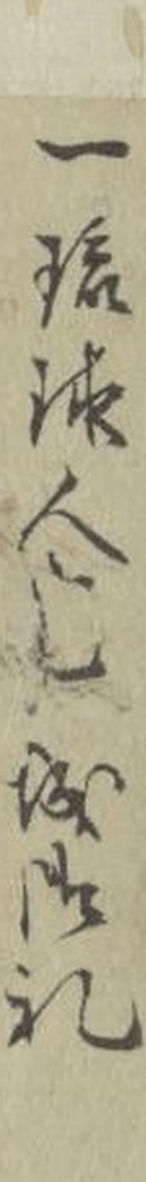一琉球人登城御礼
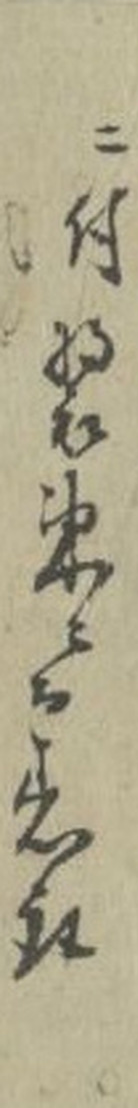に付装束に而着座
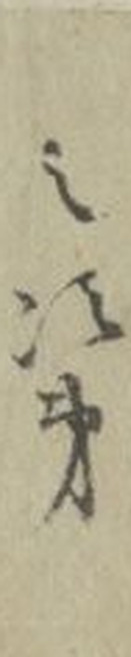之次第
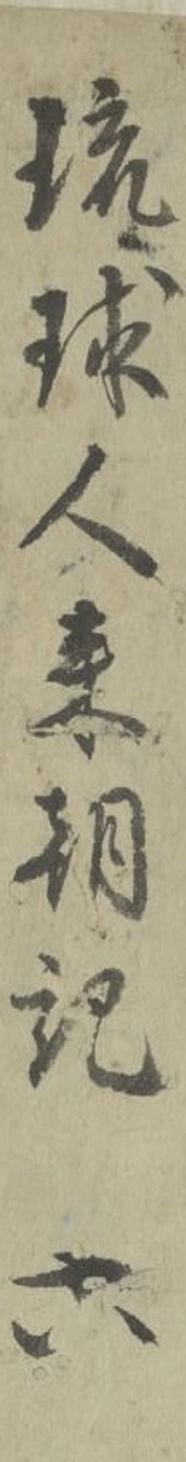琉球人来朝記六

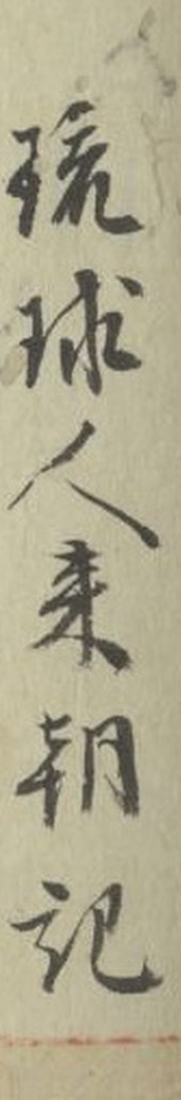琉球人来朝記
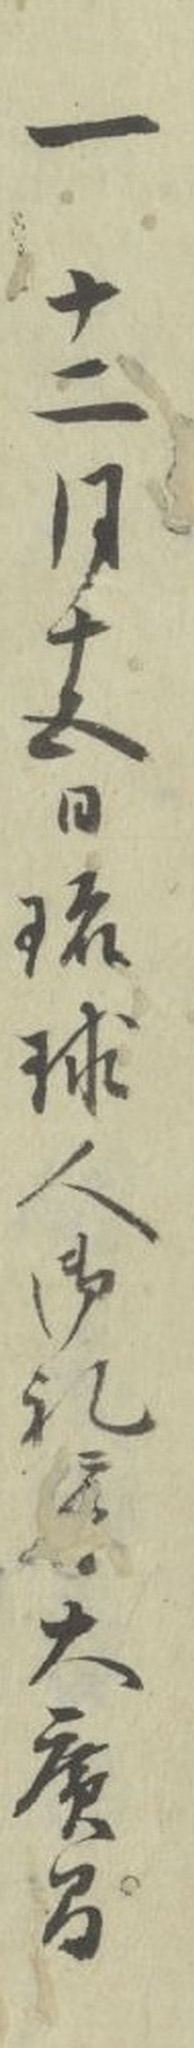一十二月十五日琉球人御礼大広間
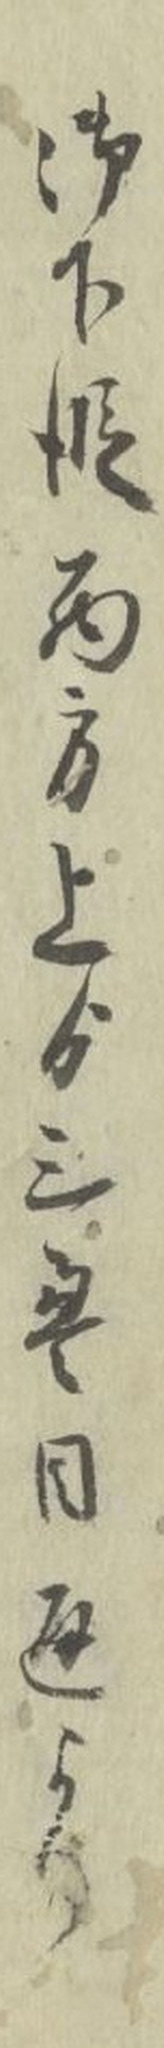御下段西方上ゟ三畳目通より
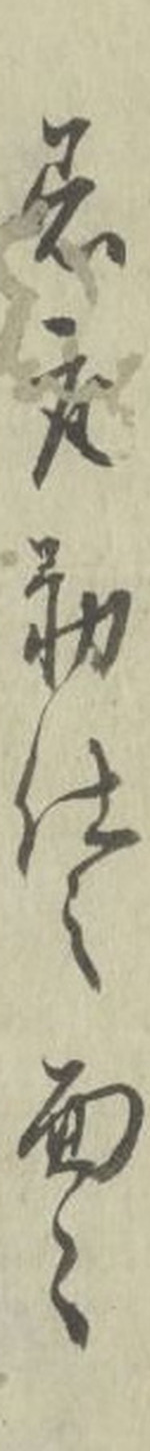着座勤仕之面々
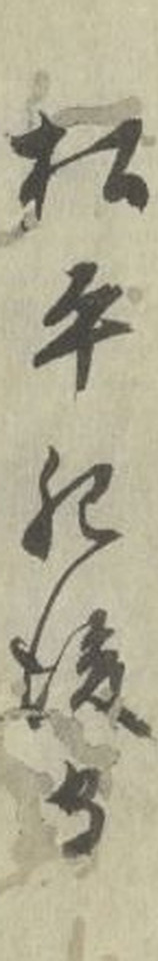直垂松平肥後守

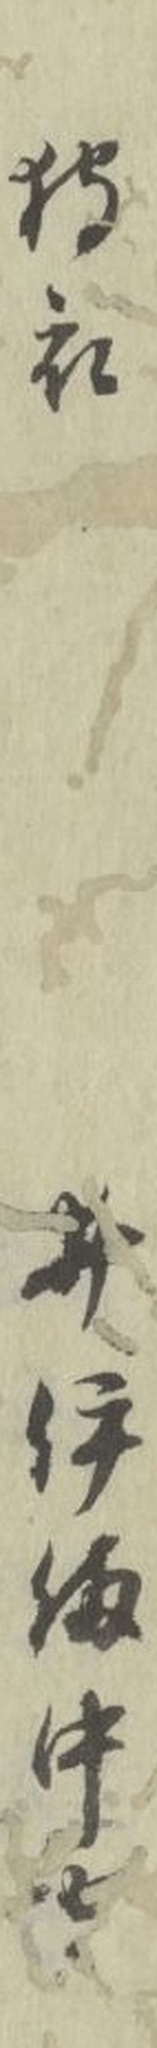狩衣井伊備中守
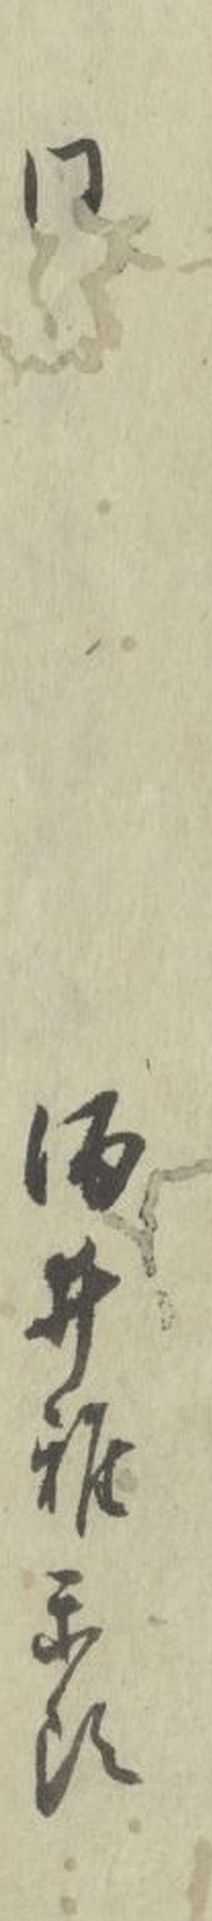同酒井雅楽頭
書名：琉球来朝記 自一至七
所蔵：University of the Ryukyus Library
